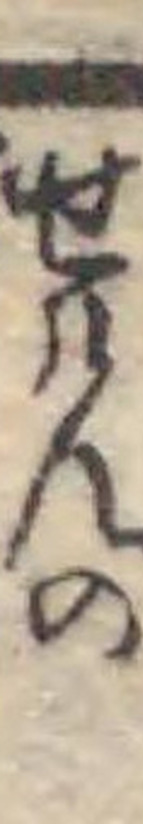せけんの
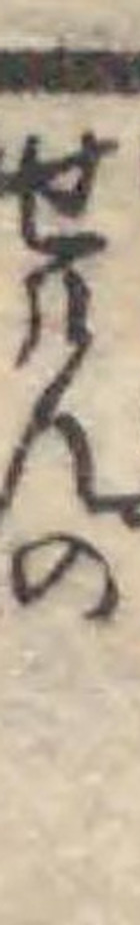せけんの
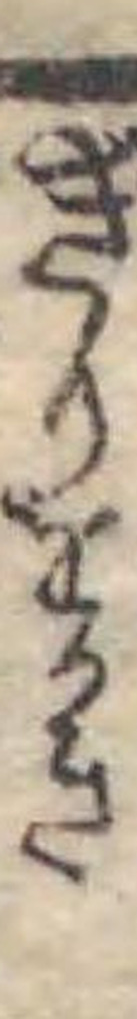ぎりをかき
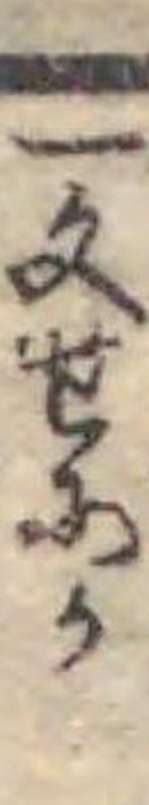一文せにか
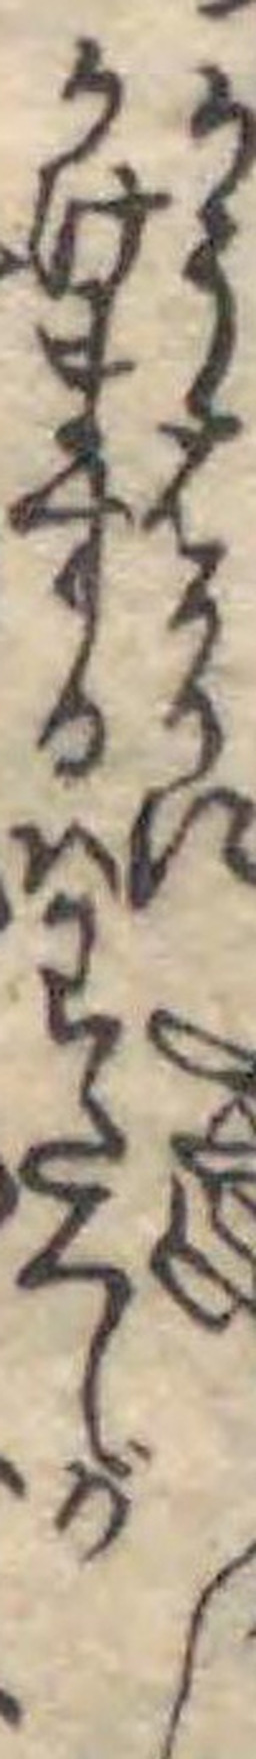かけまするはわたくしが
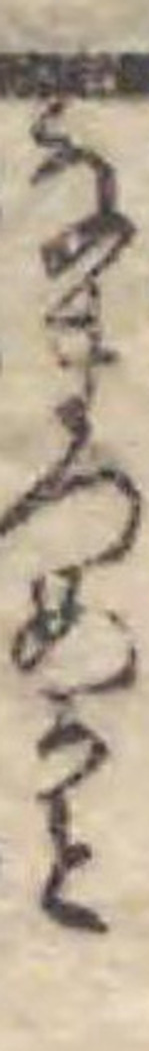なまつめかと
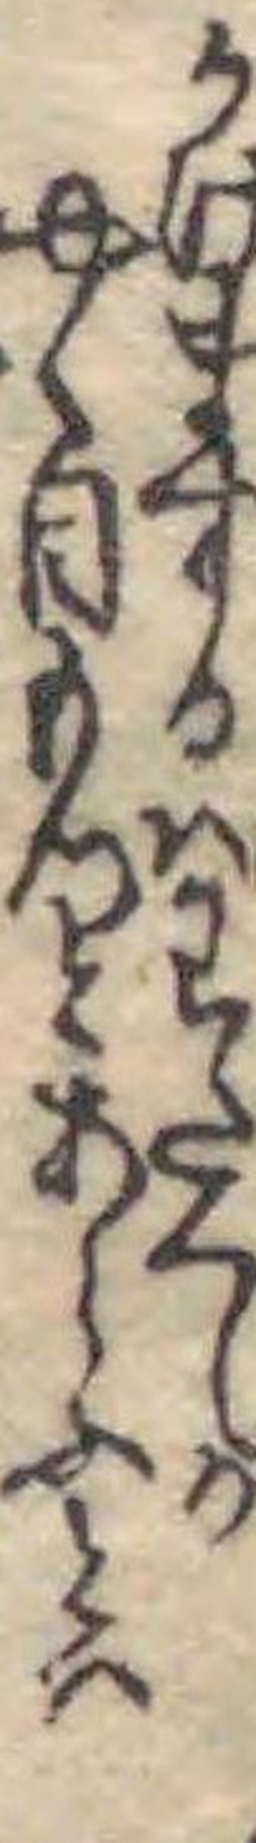やく目もつとあらふとは
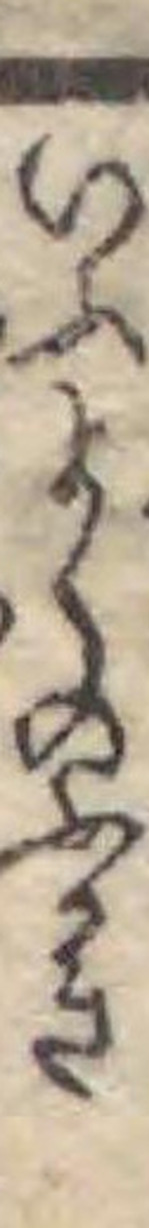いふよくのふかき
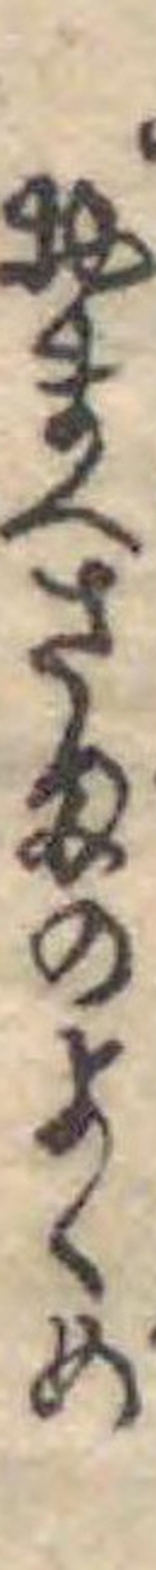おまへさまのよくめ
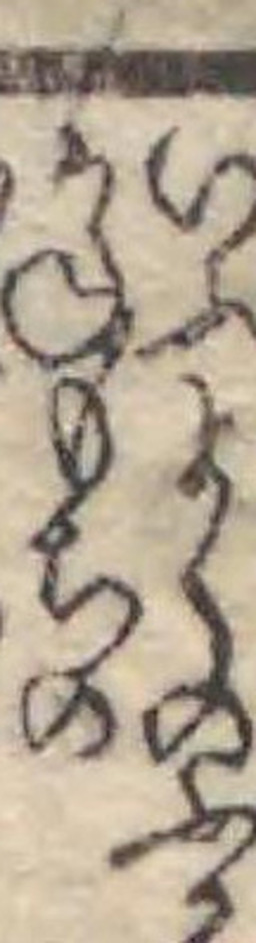かねもちの
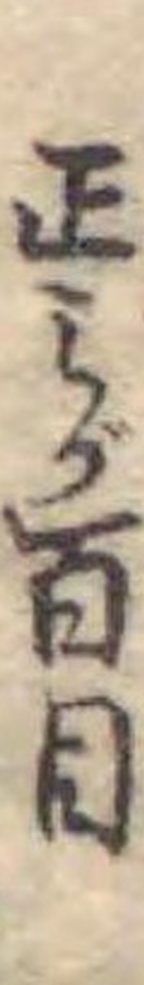正みが百目
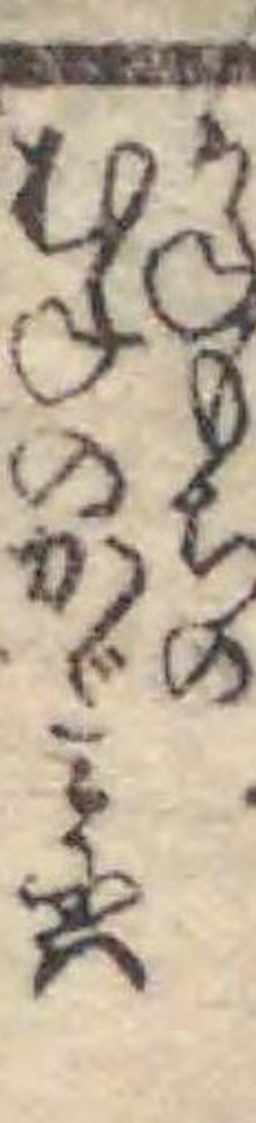むねのかゞみには
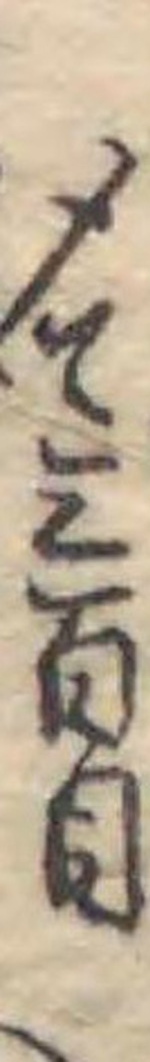〆て三百目
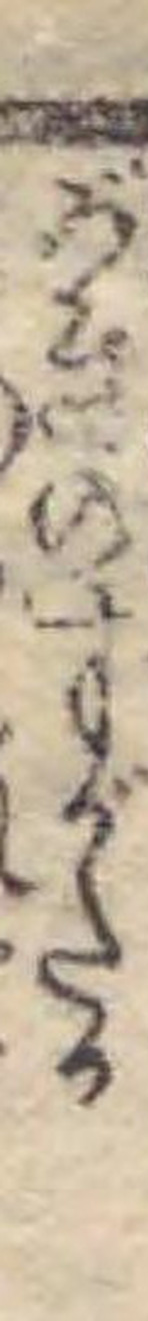がきのすがたか
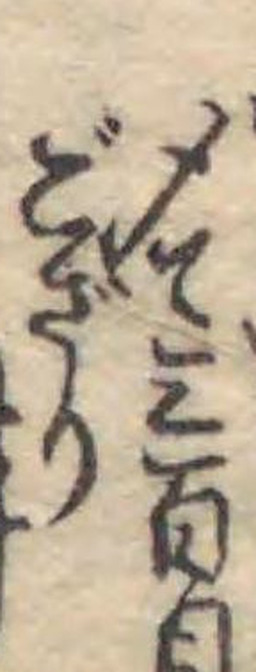ござり
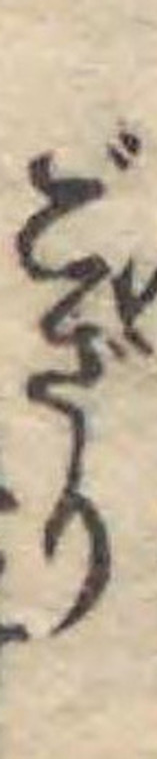ござり
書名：人心鏡写絵 : 3巻
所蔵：国立国会図書館 National Diet Library, JAPAN
